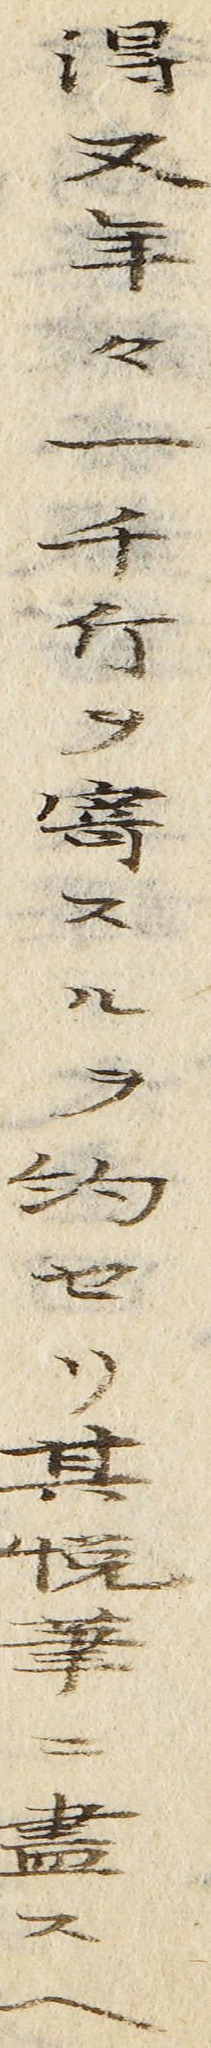得又年々一千斤ヲ寄スルヲ約セリ其悦筆ニ尽スヘ
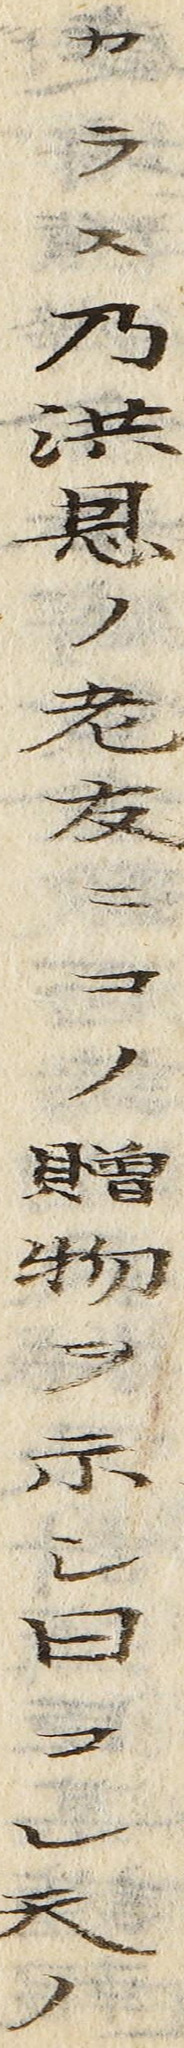カラス乃洪恩ノ老友ニコノ贈物ヲ示シ曰コレ天ノ
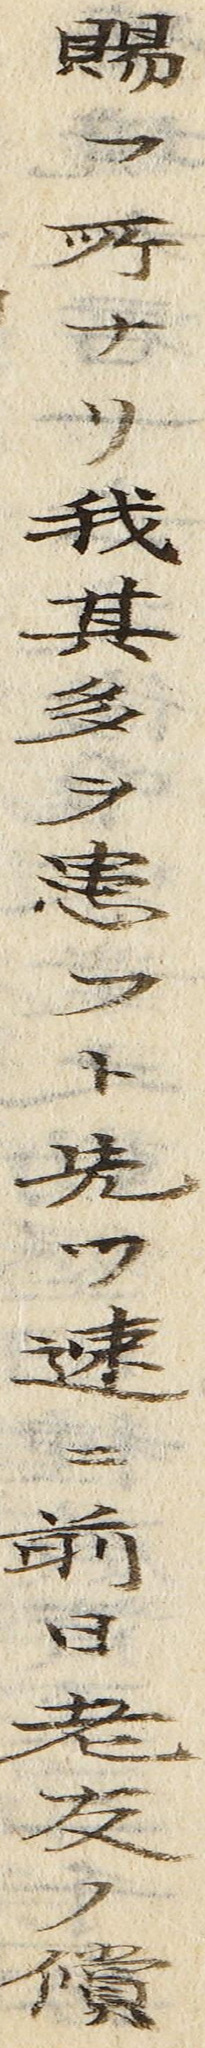賜フ所ナリ我其多ヲ患フト先ツ速ニ前日老友ノ償
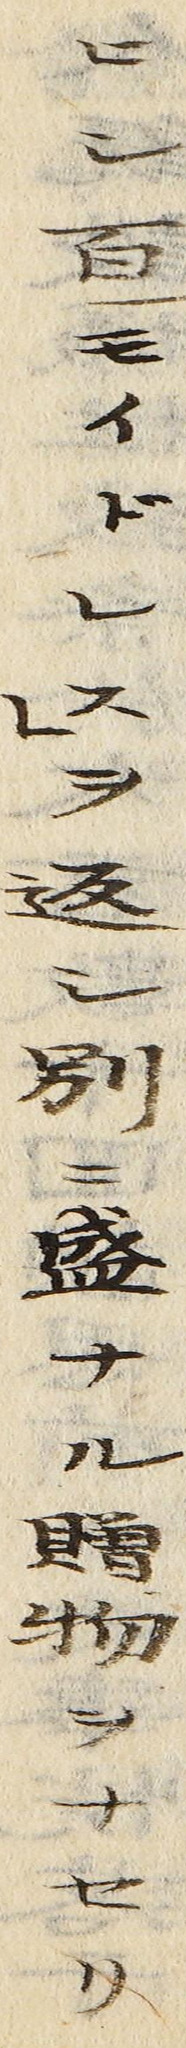ヒシ百「モイドレス」ヲ返シ別ニ盛ナル贈物ヲナセリ
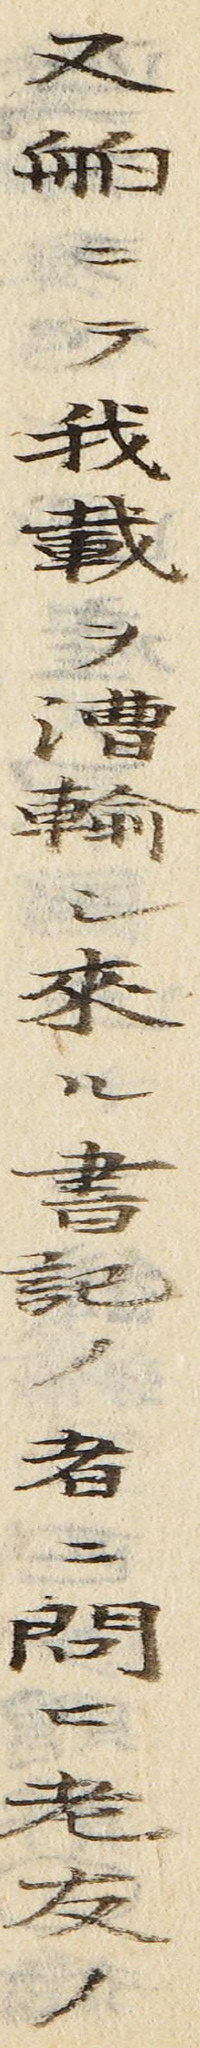又舶ニテ我載ヲ漕輸シ来ル書記ノ者ニ問ヒ老友ノ
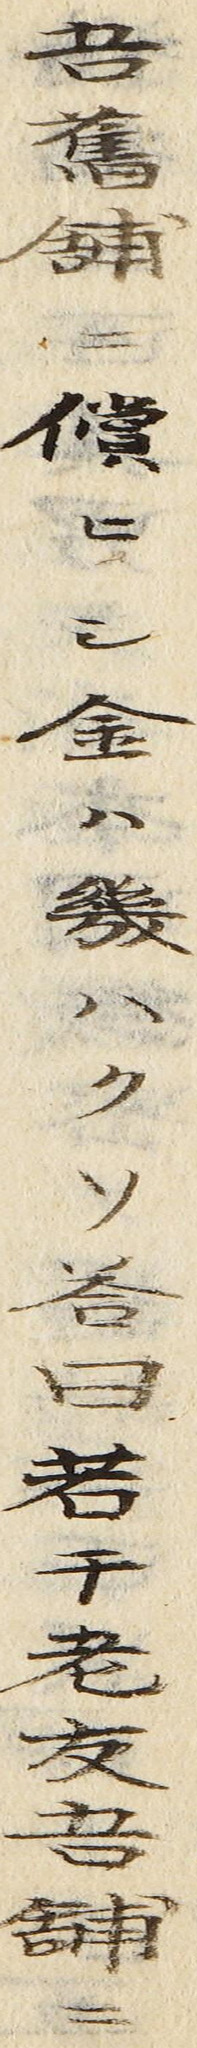我旧舗ニ償ヒシ金ハ幾ハクソ答曰若干老友吾舗ニ
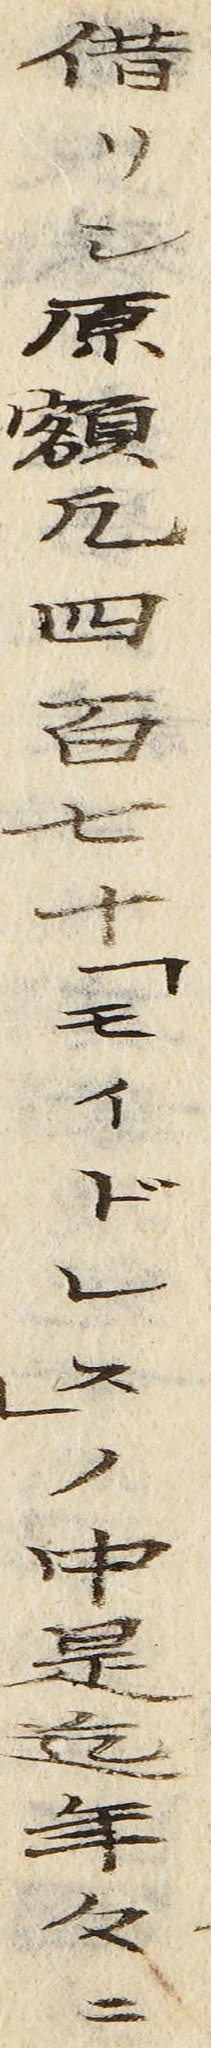借リシ原額凡四百七十「モイドレス」ノ中是迄年々ニ
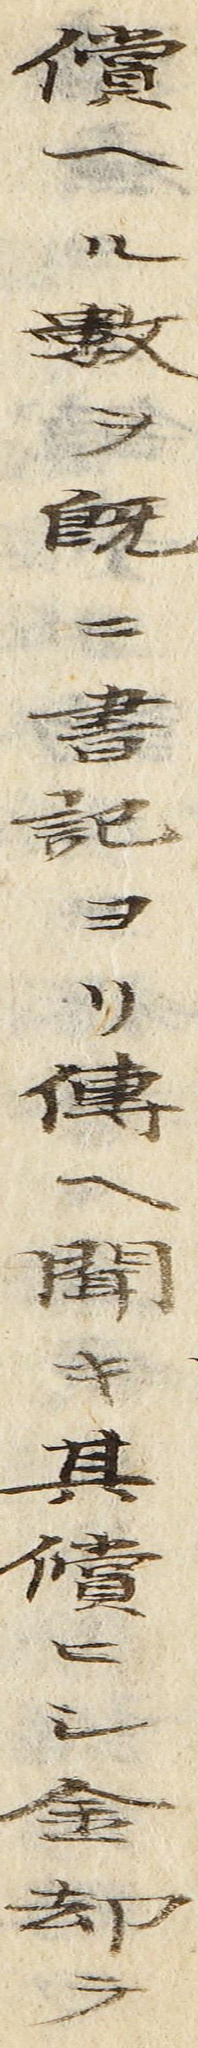償ヘル数ヲ既ニ書記ヨリ伝ヘ聞キ其償ヒシ金却テ
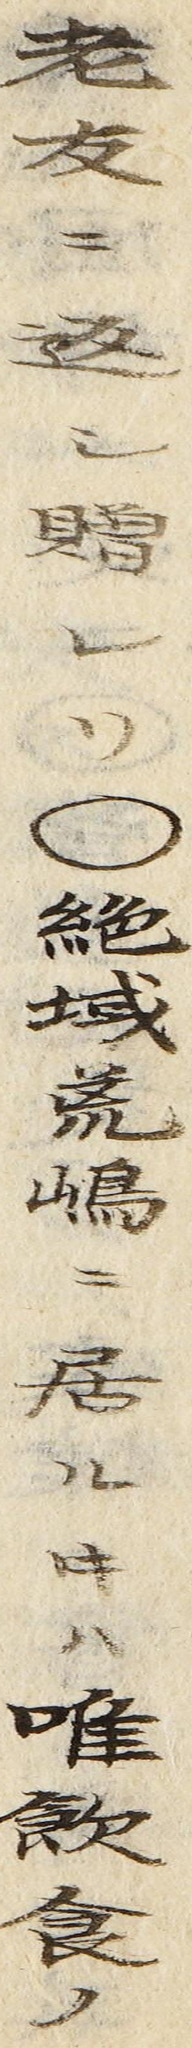老友ニ返シ贈レリ◯絶域荒嶋ニ居ルトキハ唯飲食ノ
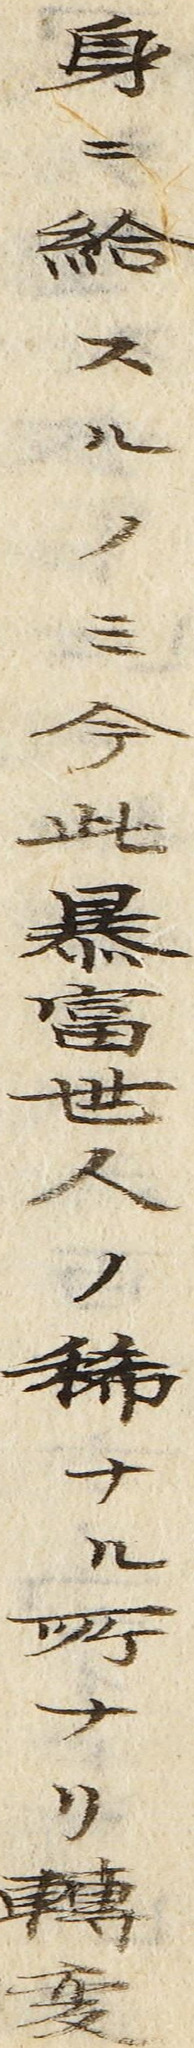身ニ給スルノミ今此暴富世人ノ稀ナル所ナリ転変
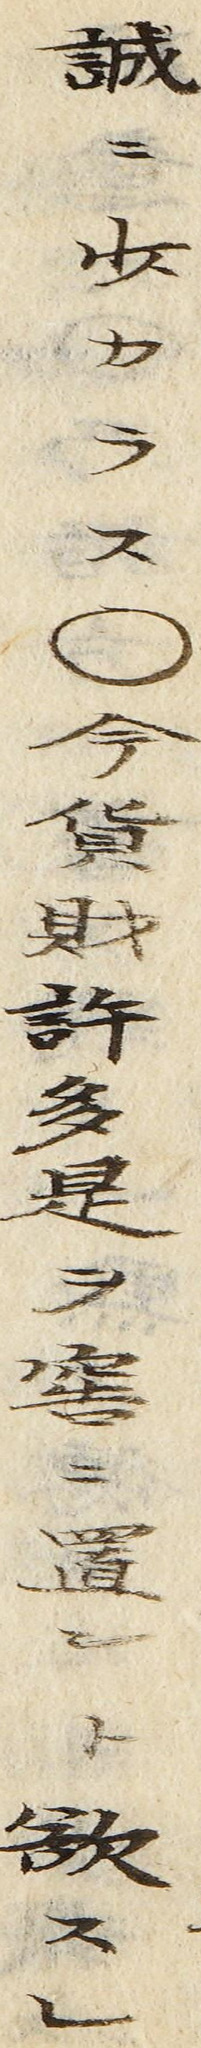誠ニ少カラス◯今貨財許多是ヲ窖ニ置ント欲スレ
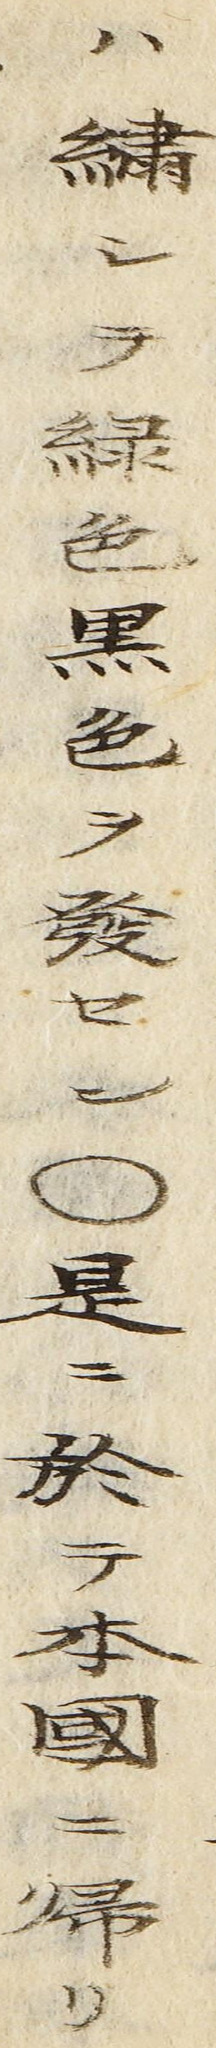ハ繍シテ緑色黒色ヲ発セン◯是ニ於テ本国ニ帰リ
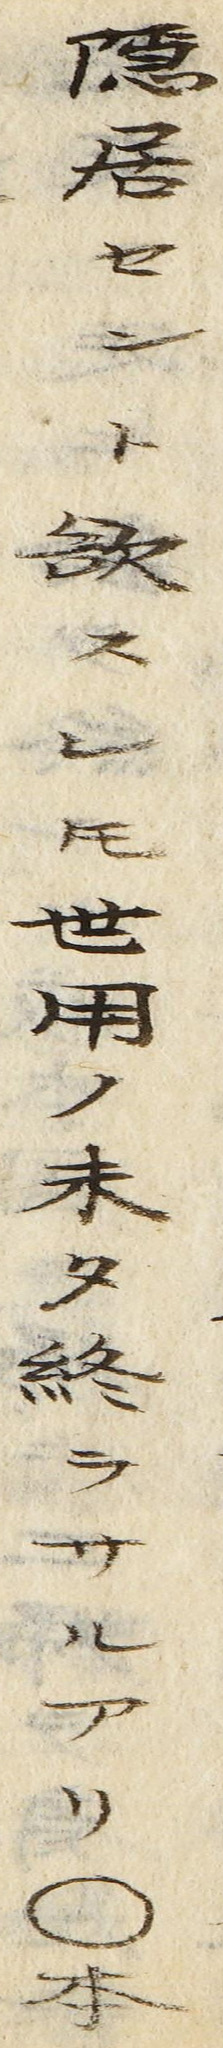隠居セント欲スレトモ世用ノ未タ終ラサルアリ◯本
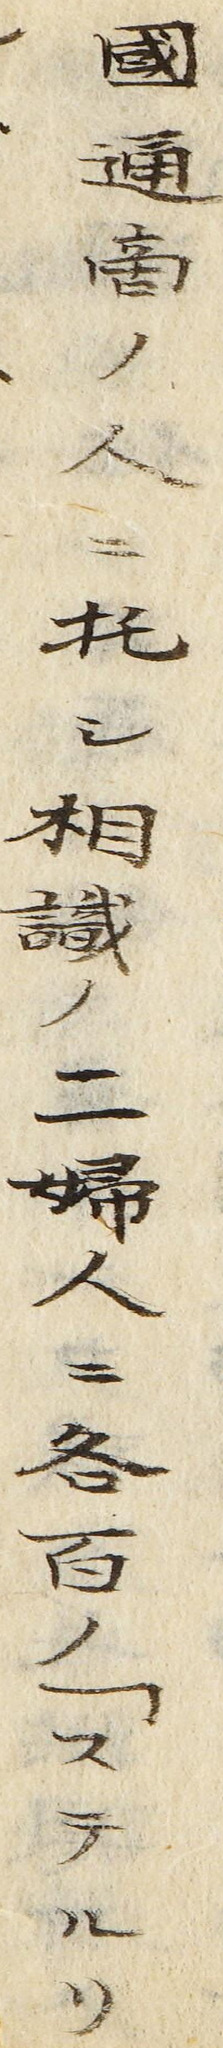国通商ノ人ニ托シ相識ノ二婦人ニ各百ノ「ステルリ
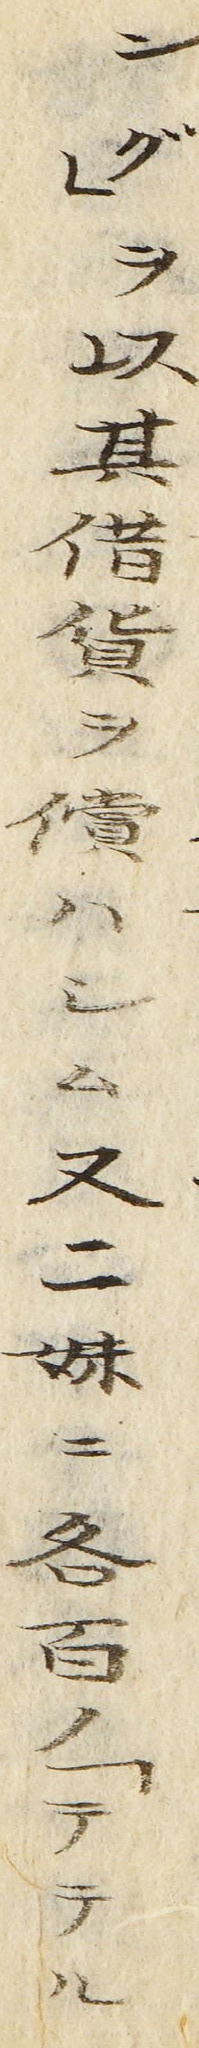ング」ヲ以其借貨ヲ償ハシム又二妹ニ各百ノ「テテル

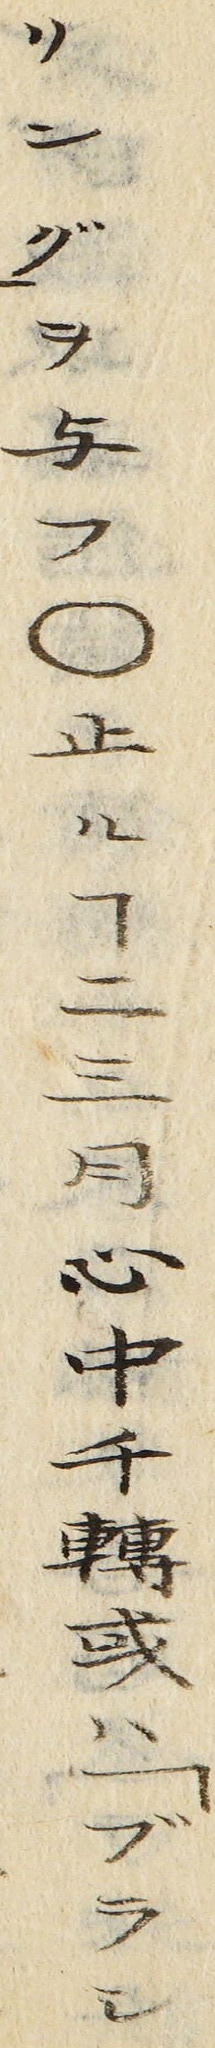リング」ヲ与フ◯止ルコト二三月心中千転或ハ「ブラシ
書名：漂流紀事
